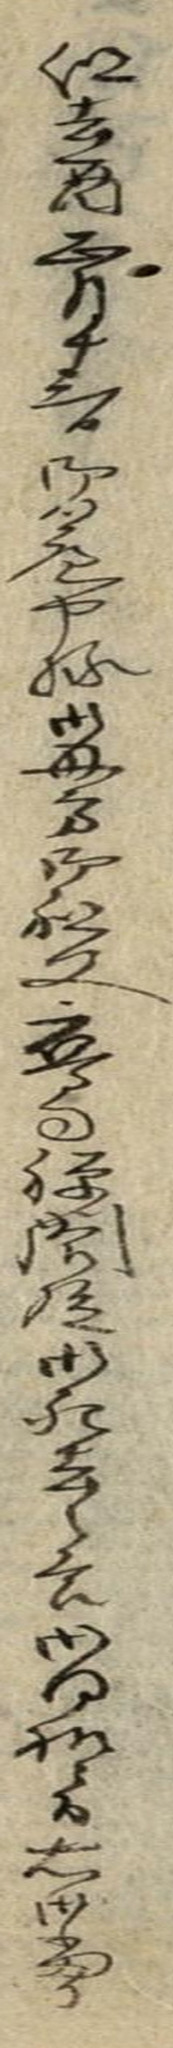但去酉正月十三日御簾中様御母方御祖父鷹司禅閤殿御死去之節御同様に付右御当り
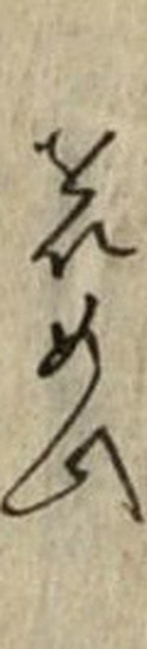を以如此
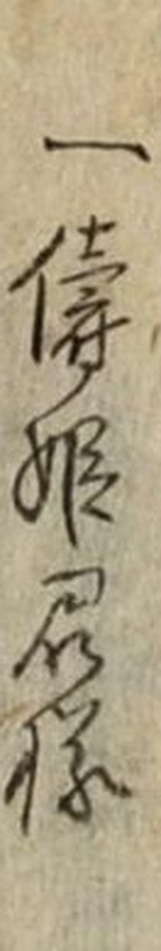一儔姫君様
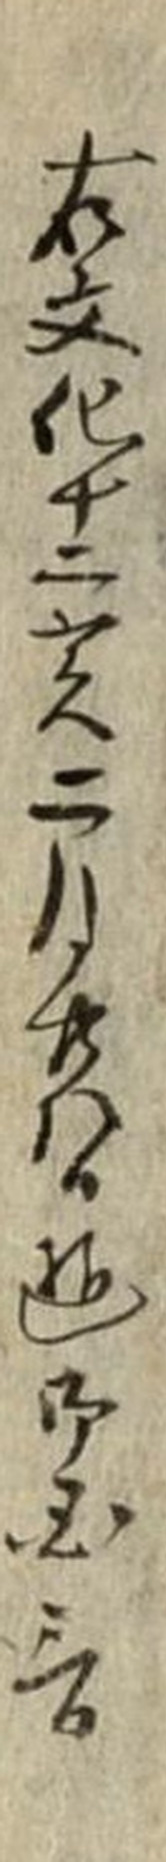右文化十二亥二月廿八日逝御国三日
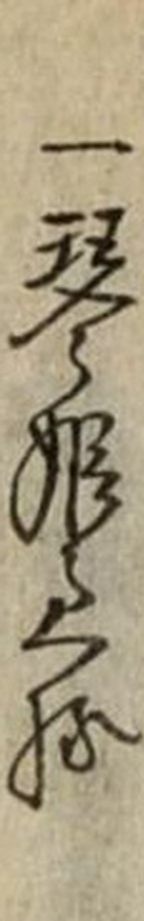一琴姫君様
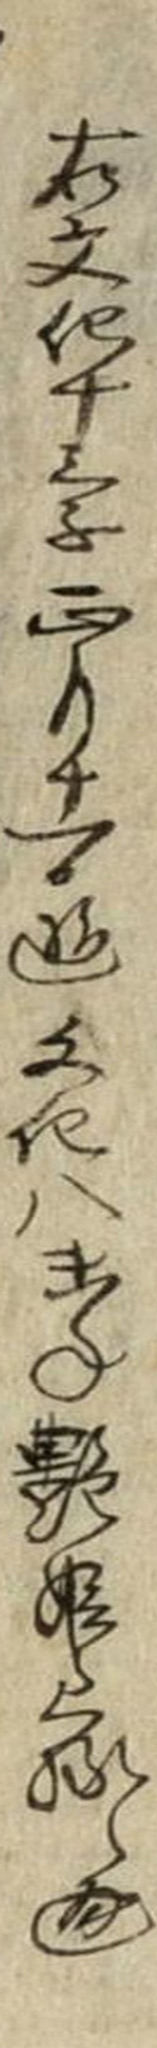右文化十三子正月十一日逝文化八未年艶姫君様之通
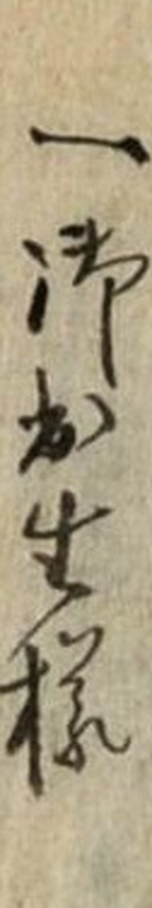一御出生様
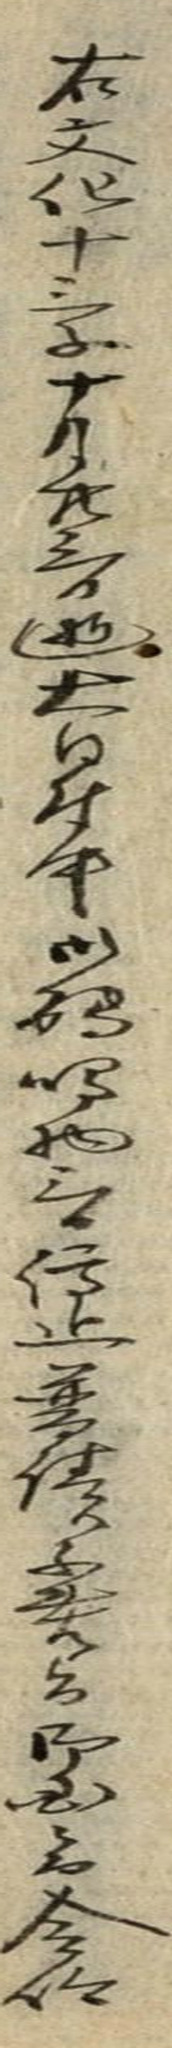右文化十三子十月廿三日逝大目付中御触鳴物三日停止普請は不苦旨御国にて令吟
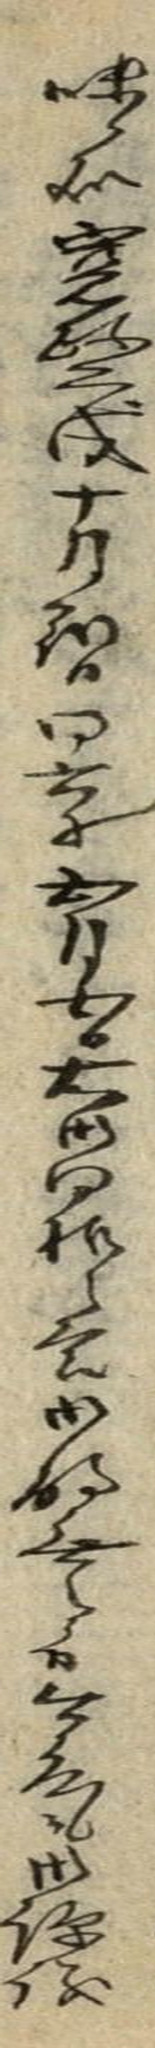味候処寛政二戌十月朔日同六刁五月五日右御同様之節御触無之に付今度も御評議
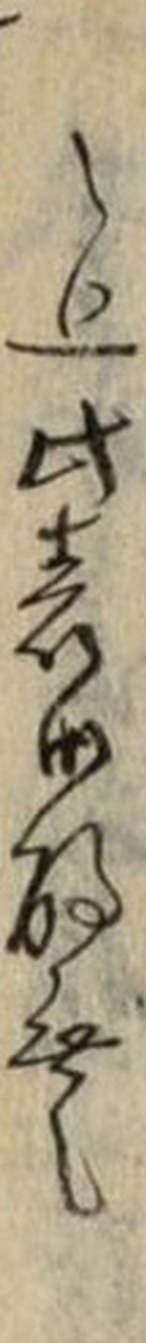之上此表御触無之
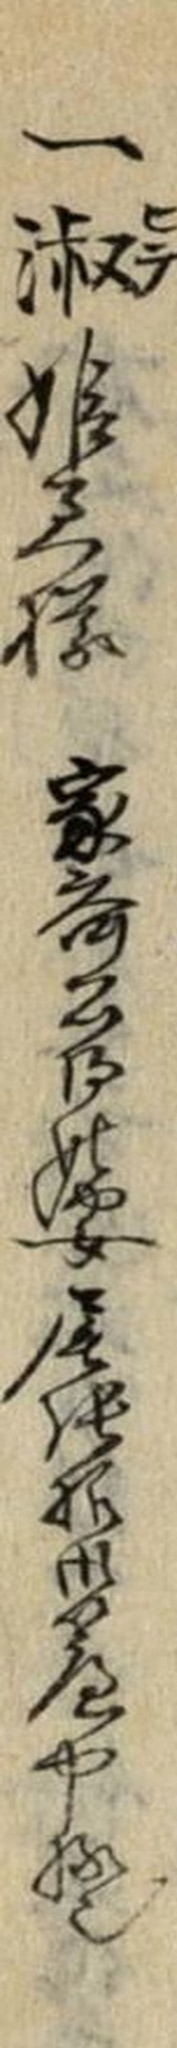一淑姫君様家斉公御嫡女尾張様御簾中様也
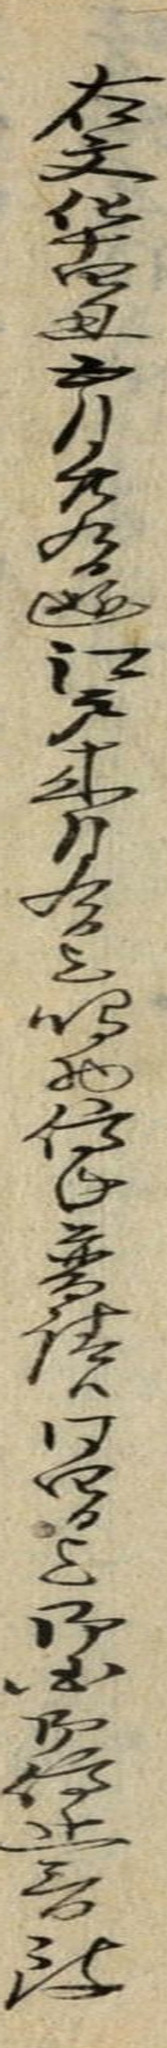右文化十四丑五月廿九日逝江戸来月九日迄鳴物停止普請は同四日迄御国御停止三日致
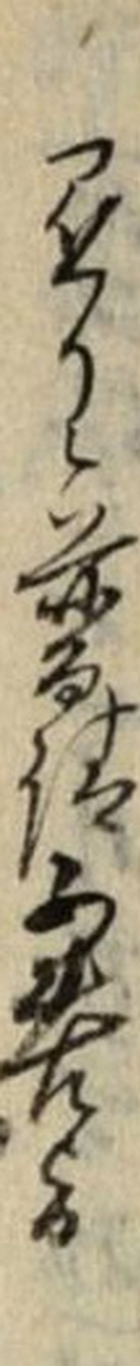懸り候普請不苦旨
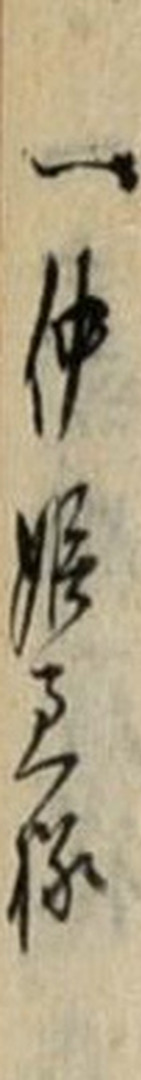一仲姫君様
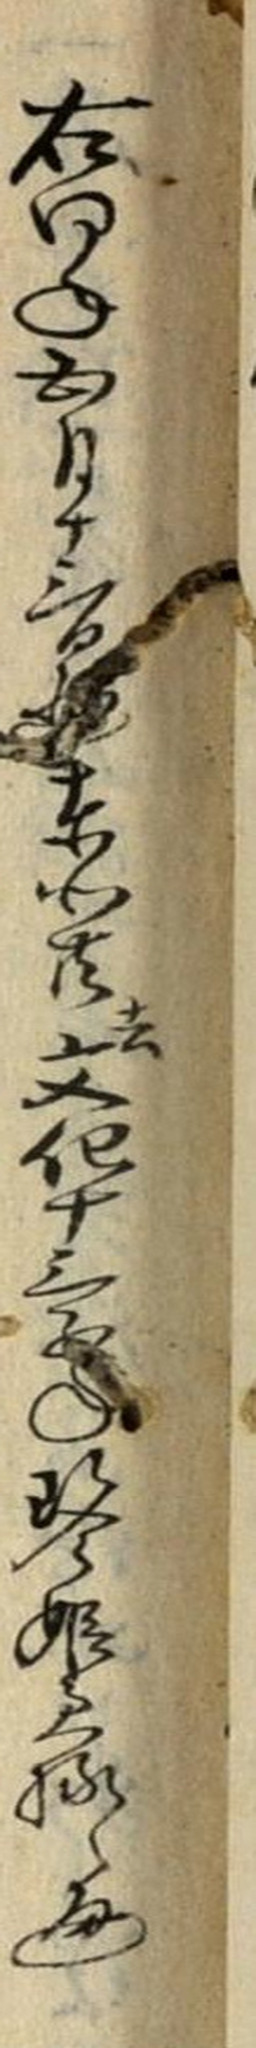右同年五月十三日逝東北共去文化十三子年琴姫君様之通
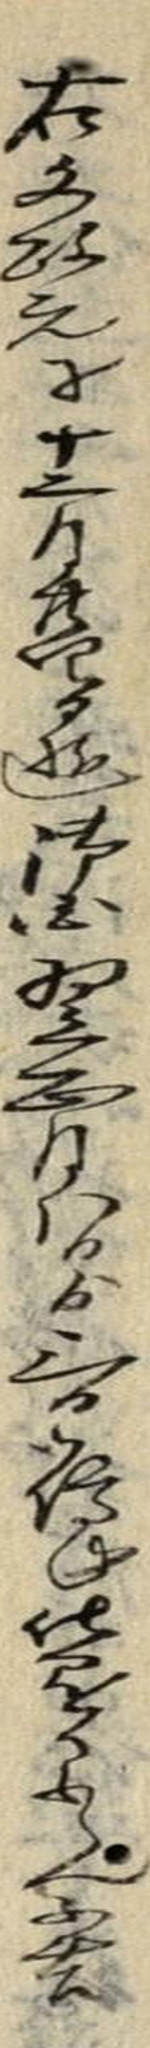右文政元刁十二月廿四日逝御国翌正月八日ゟ三日御停止仕懸りふしん不苦
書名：御停止異変死失
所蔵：福井県文書館 Fukui Prefectural Archives
